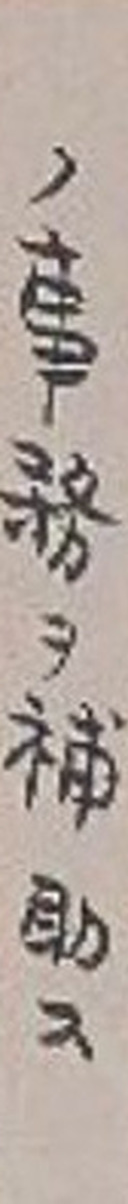ノ事務ヲ補助ス
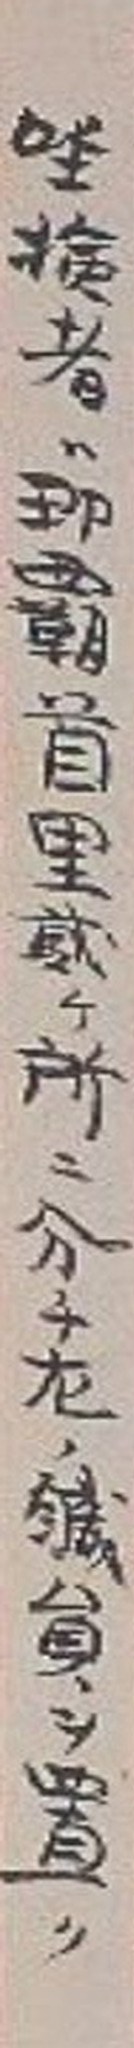坐検者ハ那覇首里弐ヶ所ニ分チ左ノ職員ヲ置ク
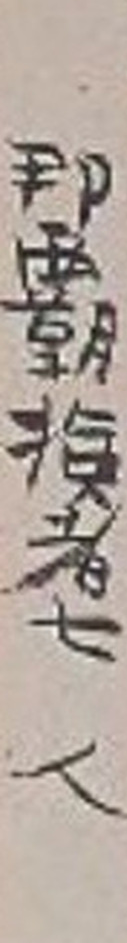那覇検者七人
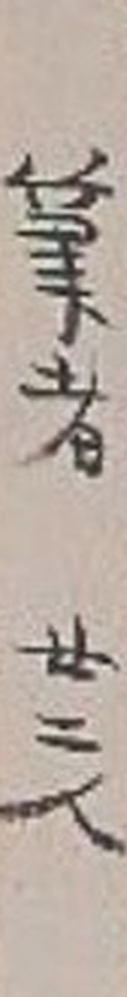筆者廿二人
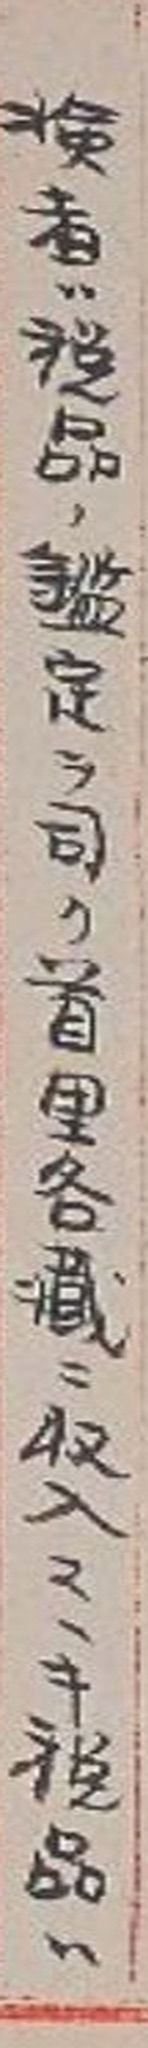検者ハ税品ノ鑑定ヲ司リ首里各蔵ニ収入スヘキ税品ハ
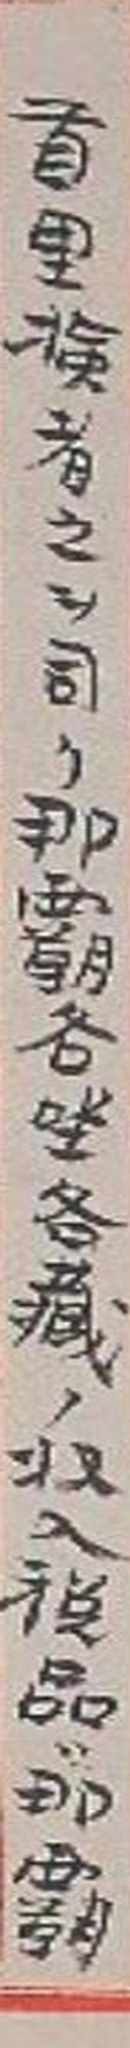首里検者之ヲ司リ那覇各坐各蔵ノ収入税品ハ那覇
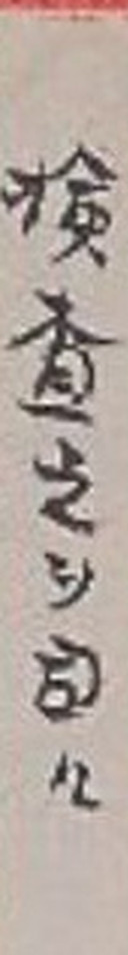検査之ヲ司ル
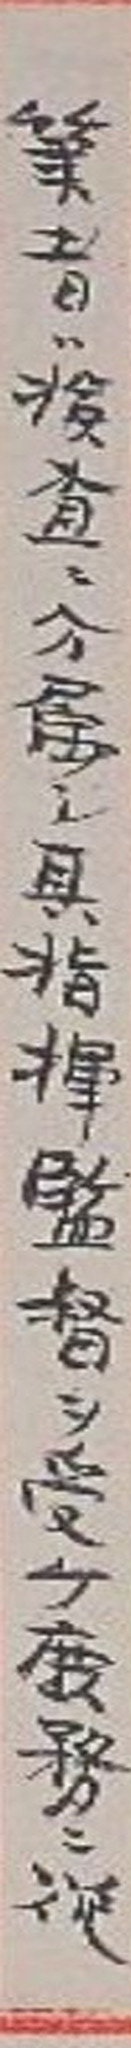筆者ハ検査ニ分属シ其指揮監督ヲ受ケ庶務ニ従
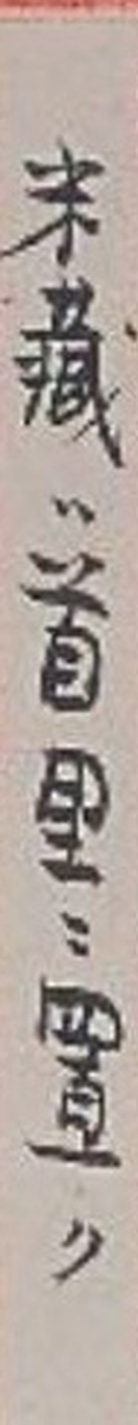米蔵ハ首里ニ置ク
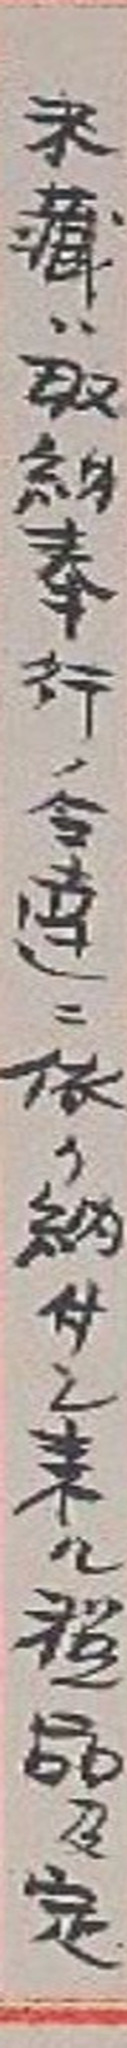米蔵ハ取納奉行ノ令達ニ依リ納付シ来ル税品及定
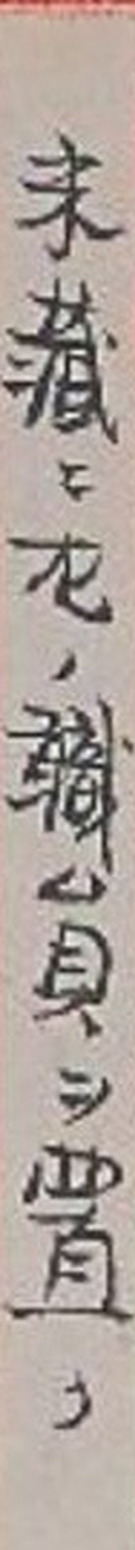米蔵ニ左ノ職員ヲ置ク
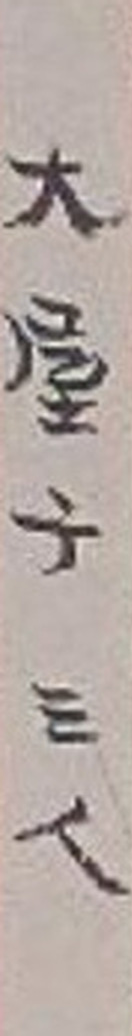大屋子三人
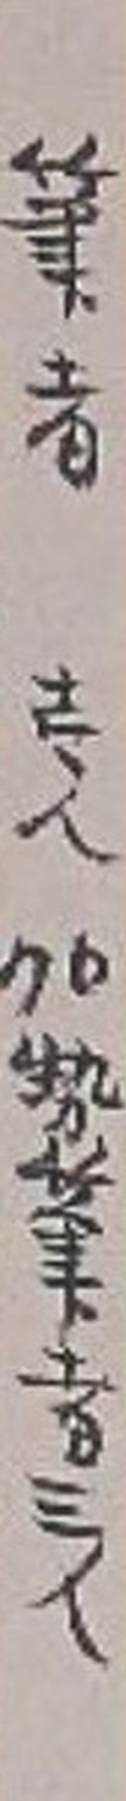筆者壱人加勢筆者三人
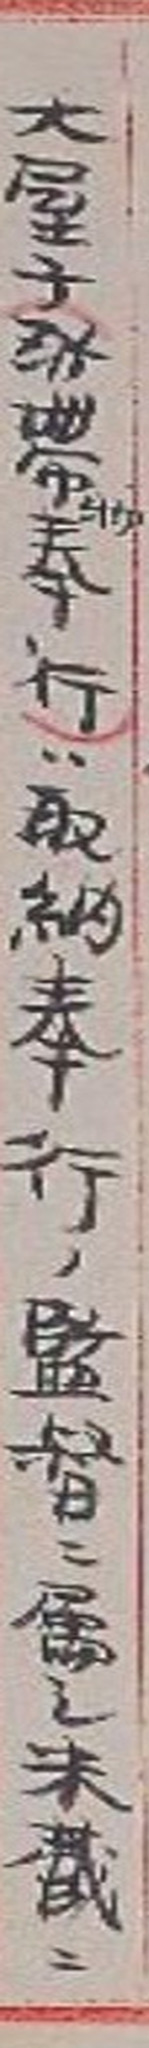大屋子所帯物奉行ハ取納奉行ノ監督ニ属シ米蔵ニ
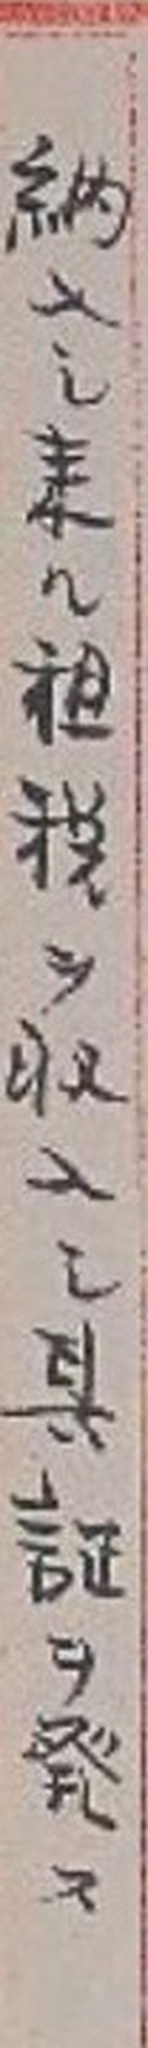納入シ来ル租税ヲ収入シ其証ヲ発ス

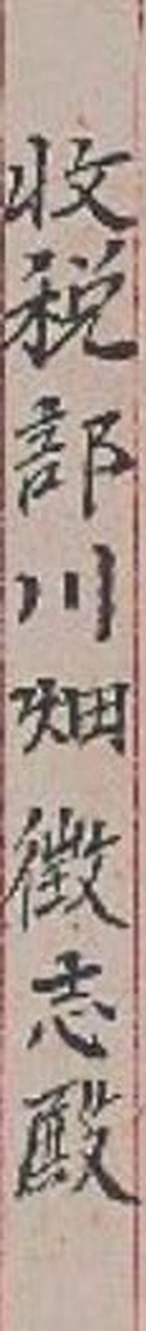収税部川畑徴志殿
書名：旧藩中租税徴収ニ関スル事項
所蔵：University of the Ryukyus Library
